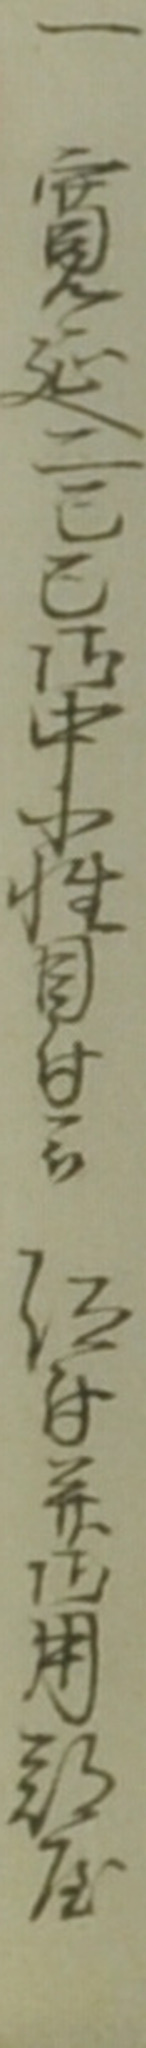一寛延二己巳御中小性目付被仰付并御用部屋
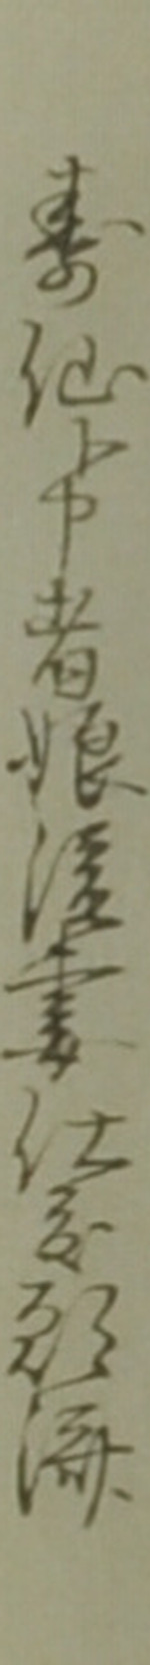寿仙申者娘後妻仕度願済

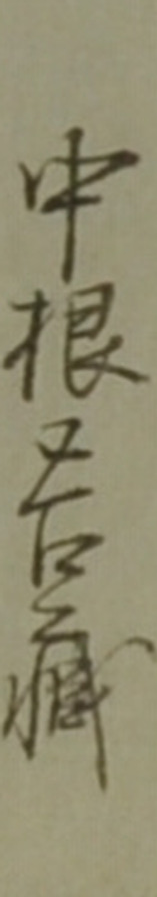中根吉蔵
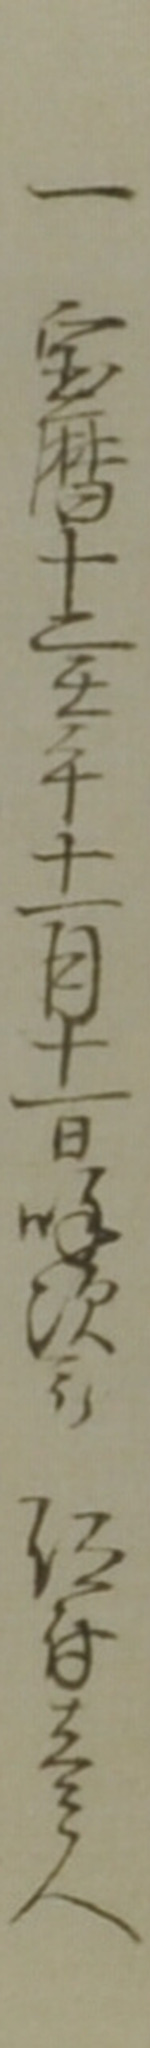一宝暦十二壬午十一月十一日呼次被仰付壱人
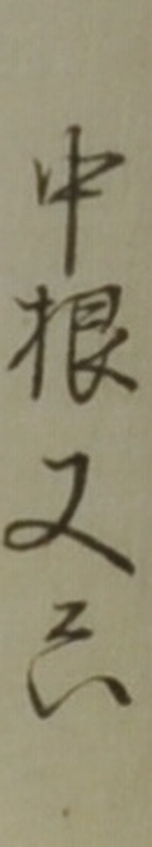中根又六

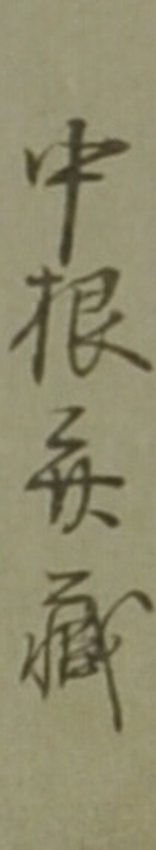中根弁蔵

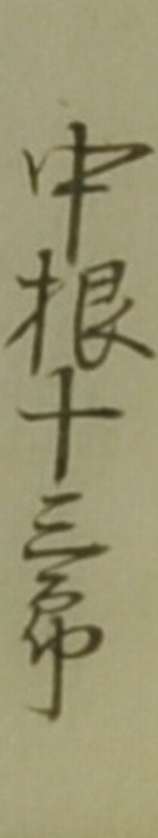中根十三郎
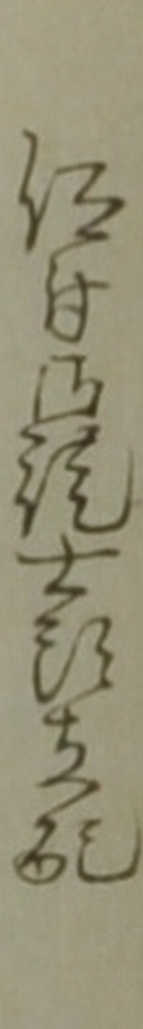仰付御徒士頭支配
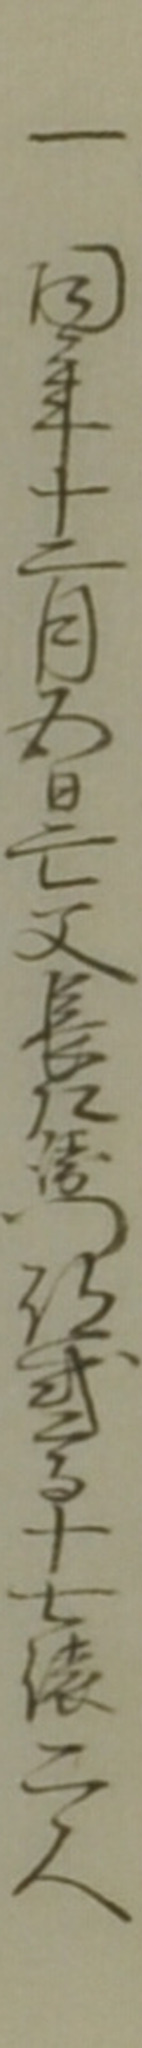一同年十二月五日亡父長左衛門跡式高十七俵二人
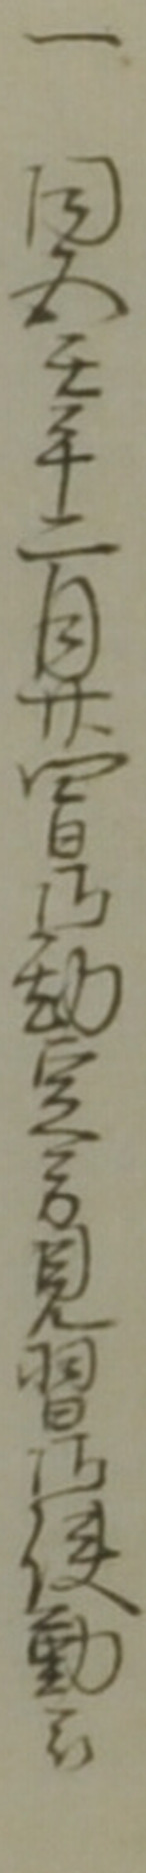一同五壬午二月廿四日御勘定方見習御使勤被
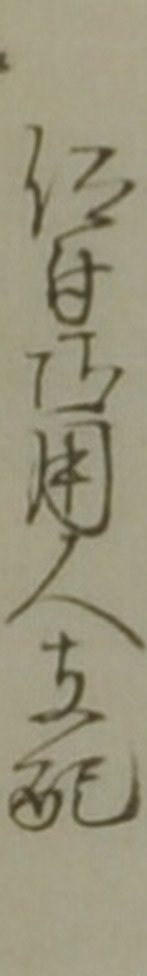仰付御用人支配
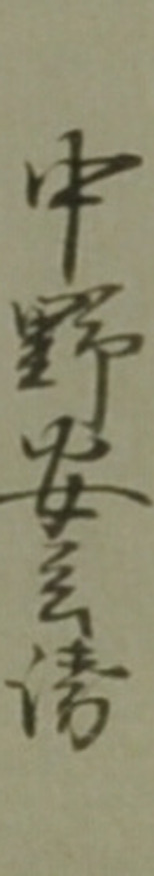中野安兵衛

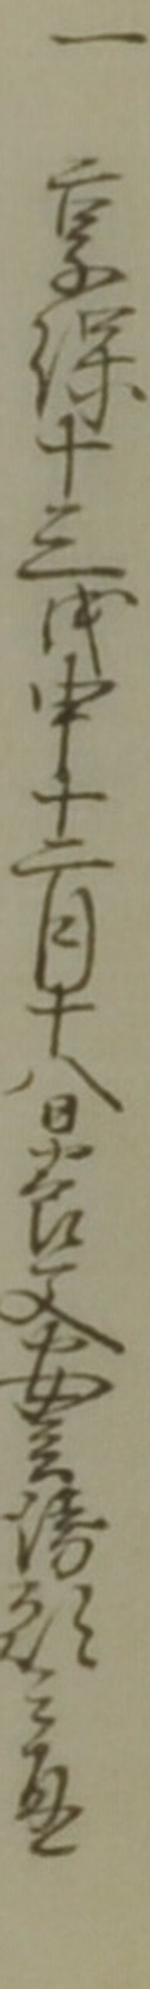一享保十三戊申十二月十八日養父安兵衛願之通
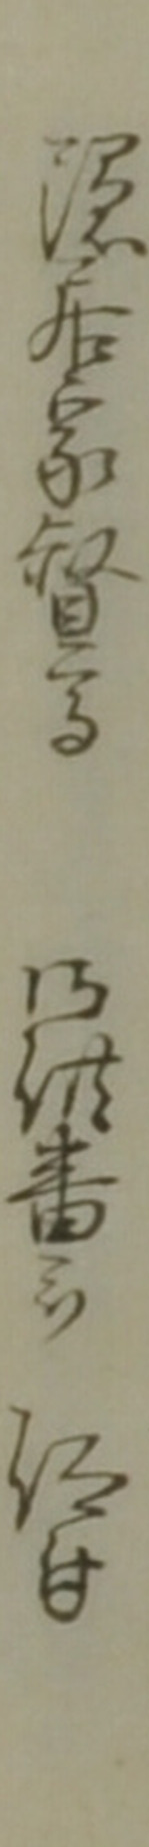隠居家督高御供番被仰付
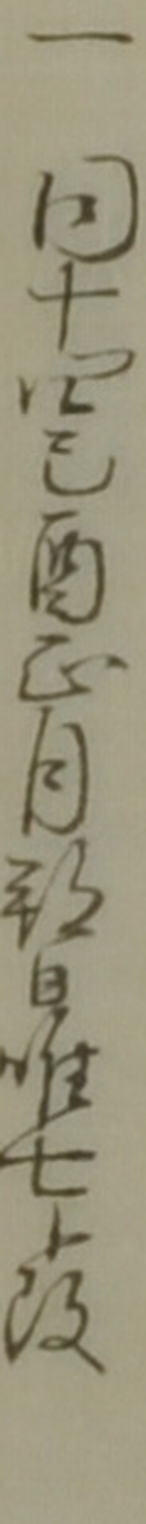一同十四己酉正月朔日唯七改
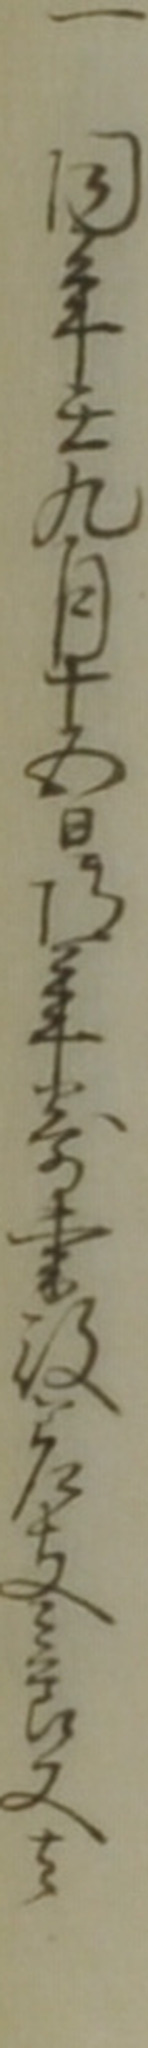一同年閏九月十五日御年寄書役差支之節又者
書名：無足廃家（弐）
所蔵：伊那市立高遠町図書館・合同会社AMANE
